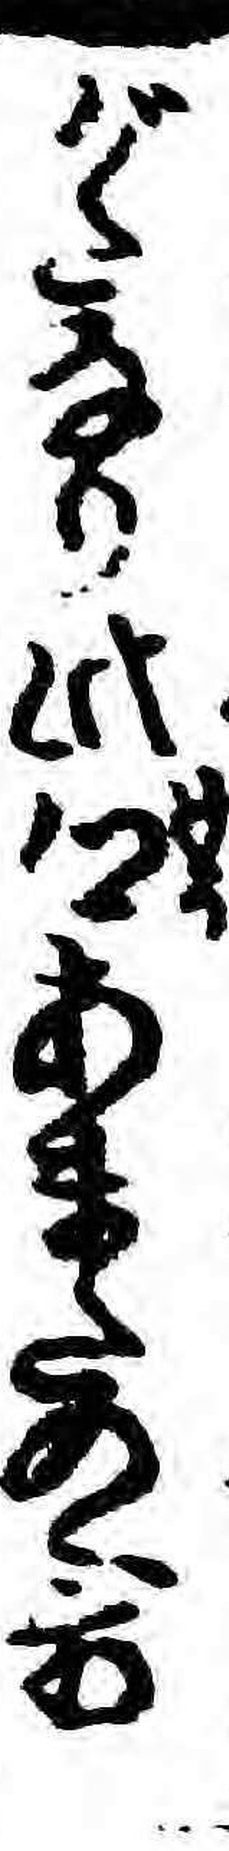がたなり此卿あまたの哥
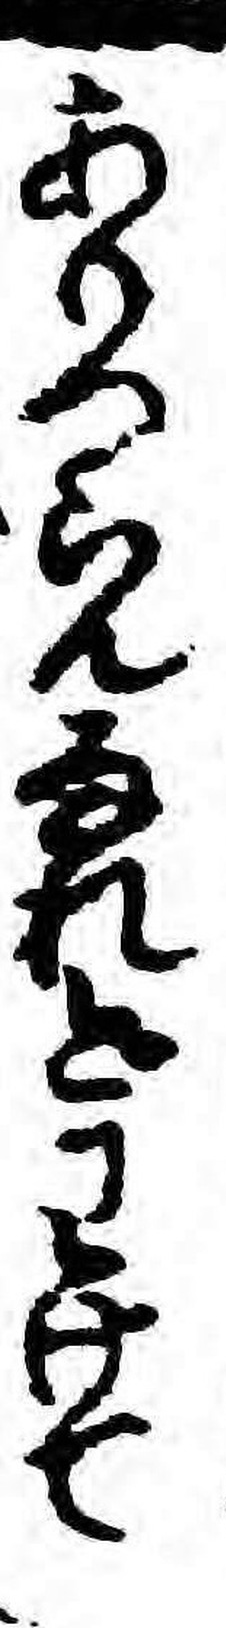ありつらんなれどわけて
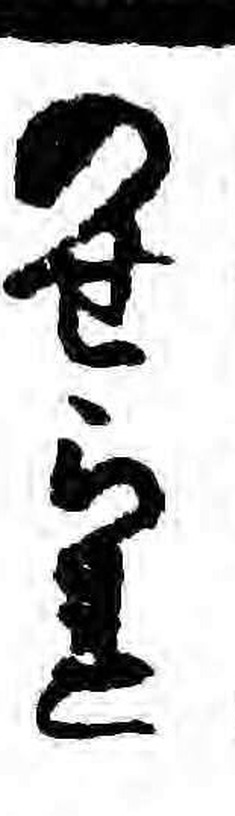のせられ
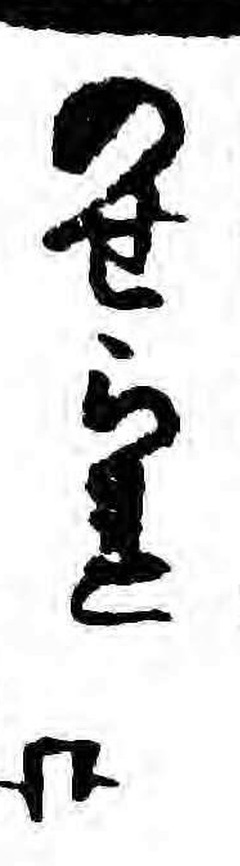のせられ
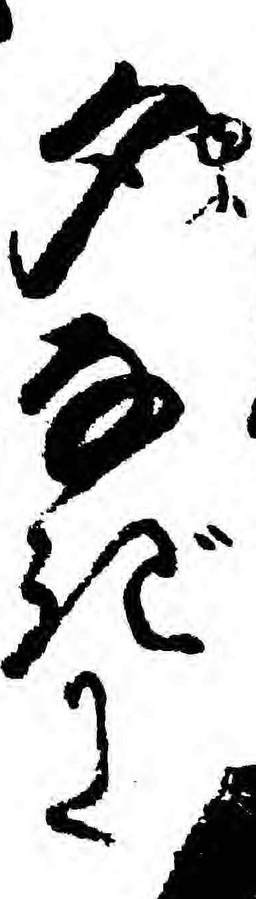夕なぎに
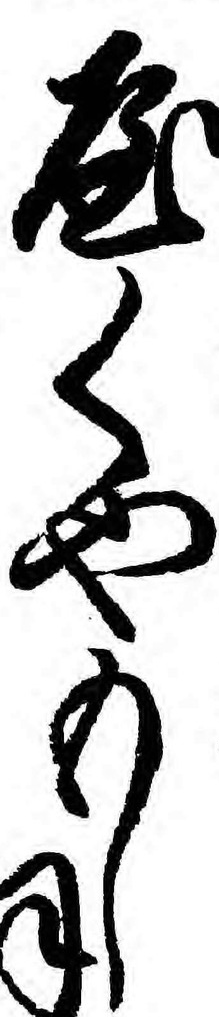やくやもしほの
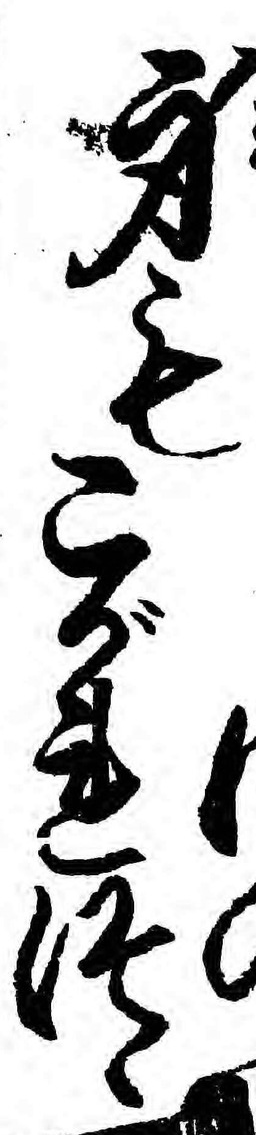身もこがれつゝ

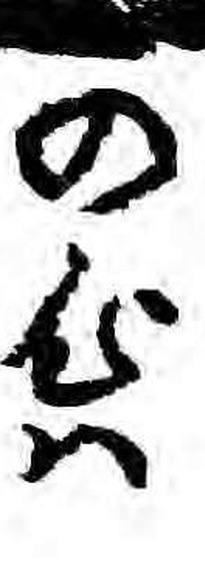の心は
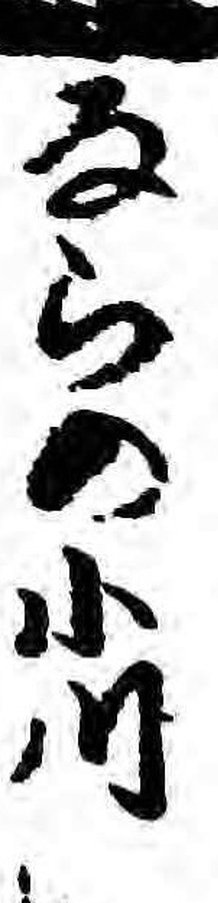ならの小川
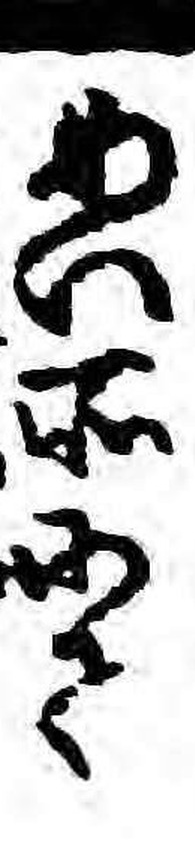めい所にて
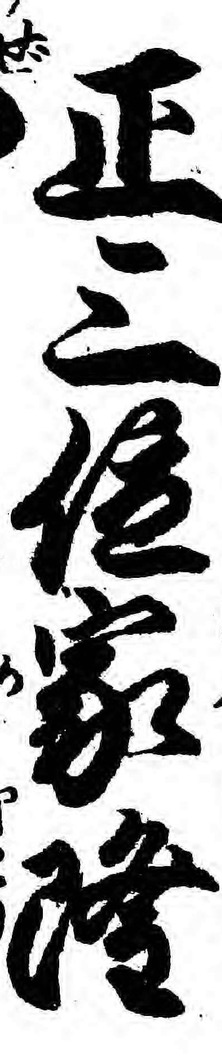正三位家隆
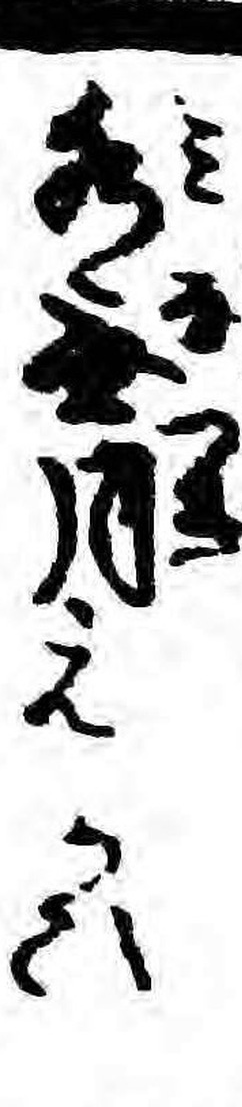水無月はらひ
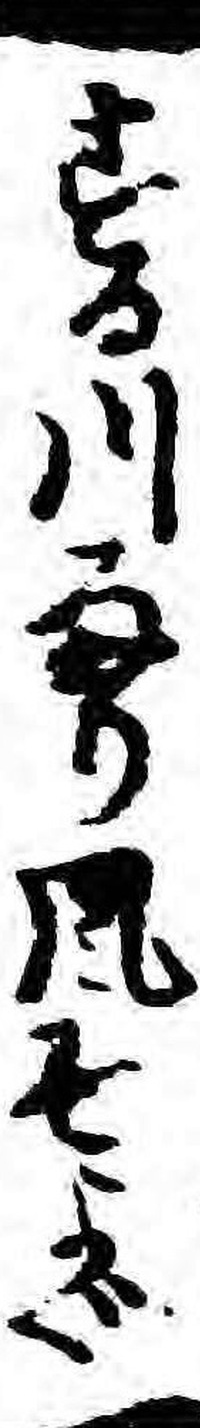する川なり風そよぐ
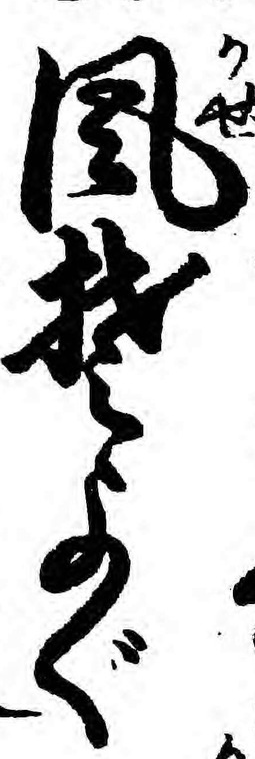風そよぐ
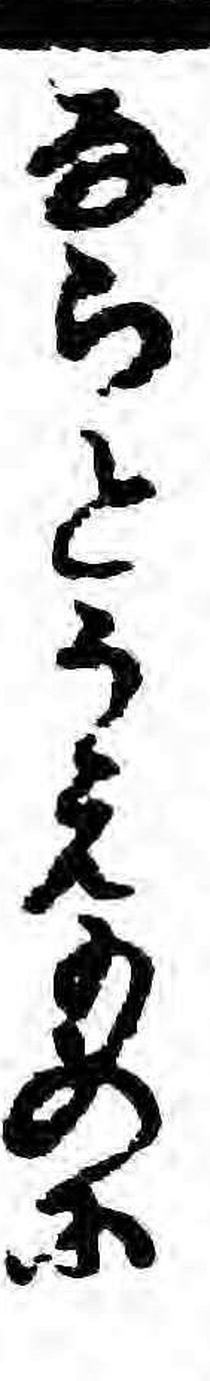ならとうえものに
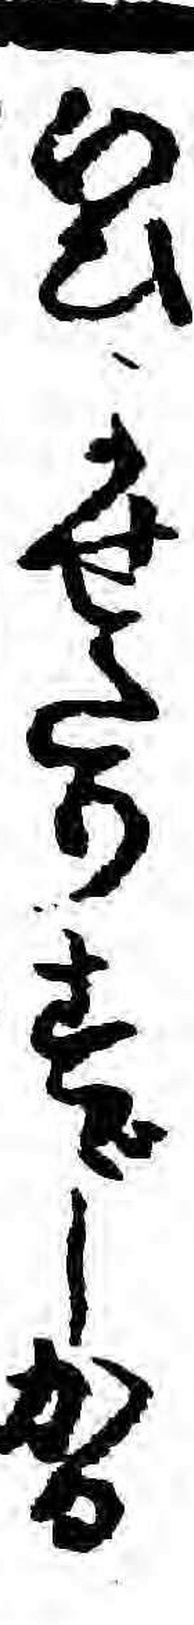いひよせたりすゞしかる
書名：頭書和歌注譯／壽賀多百人一首小倉錦
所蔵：国文学研究資料館
